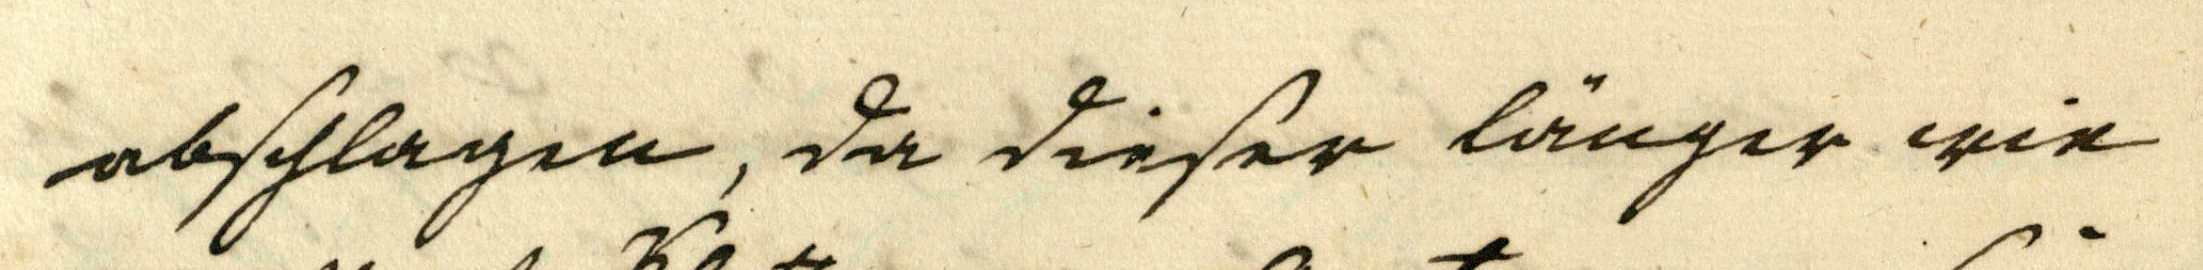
abschlagen, da dieser länger wie
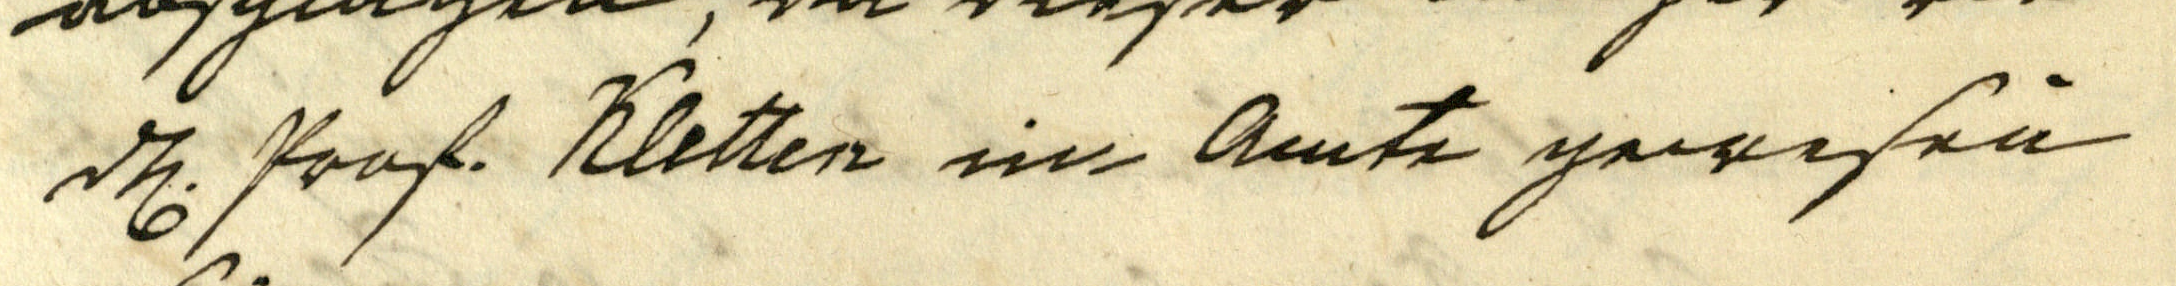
dh. Prof. Kletten im Amte gewesen
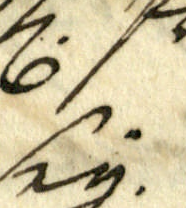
seÿ.
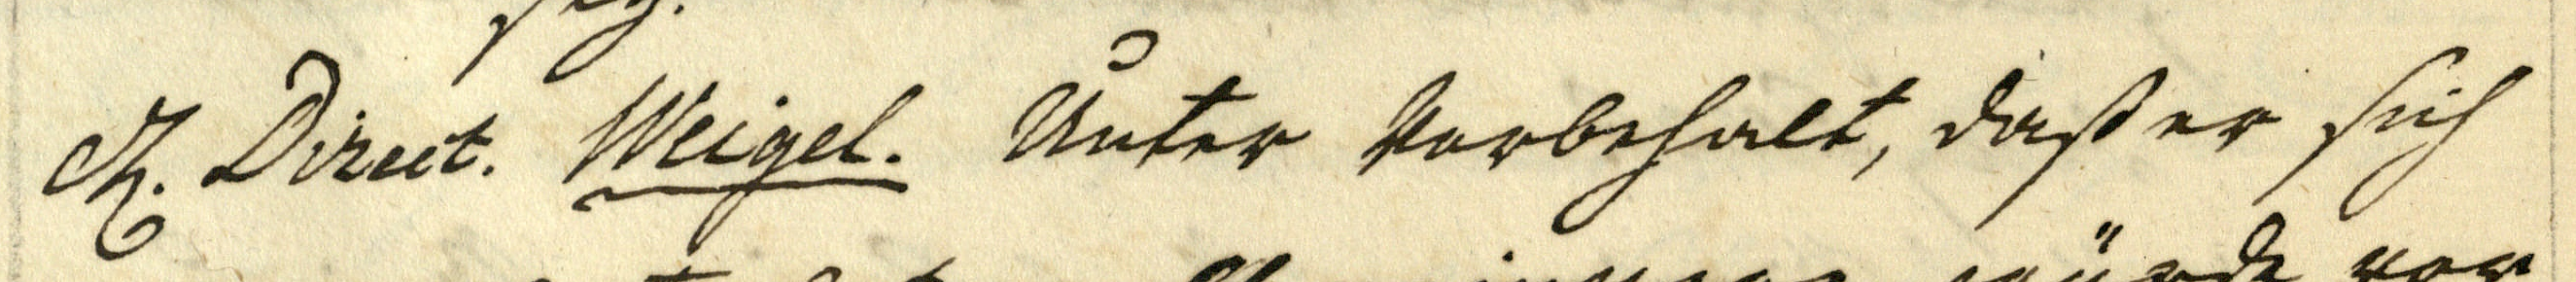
dh. Direct. Weigel. Unter Vorbehalt, daß er sich
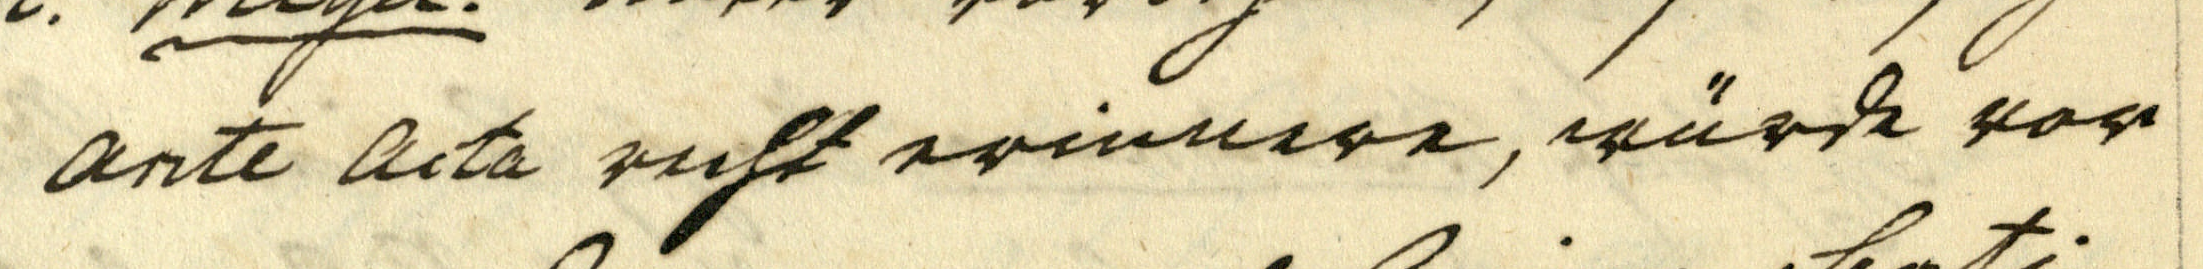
Ante Acta recht erinnere, würde vor
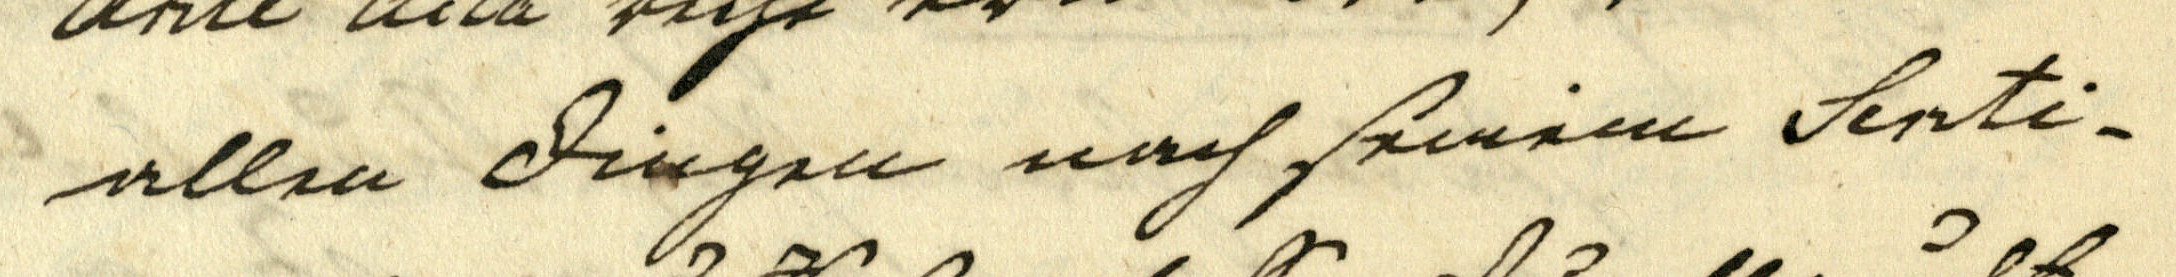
allen Dingen nach seinem Senti¬
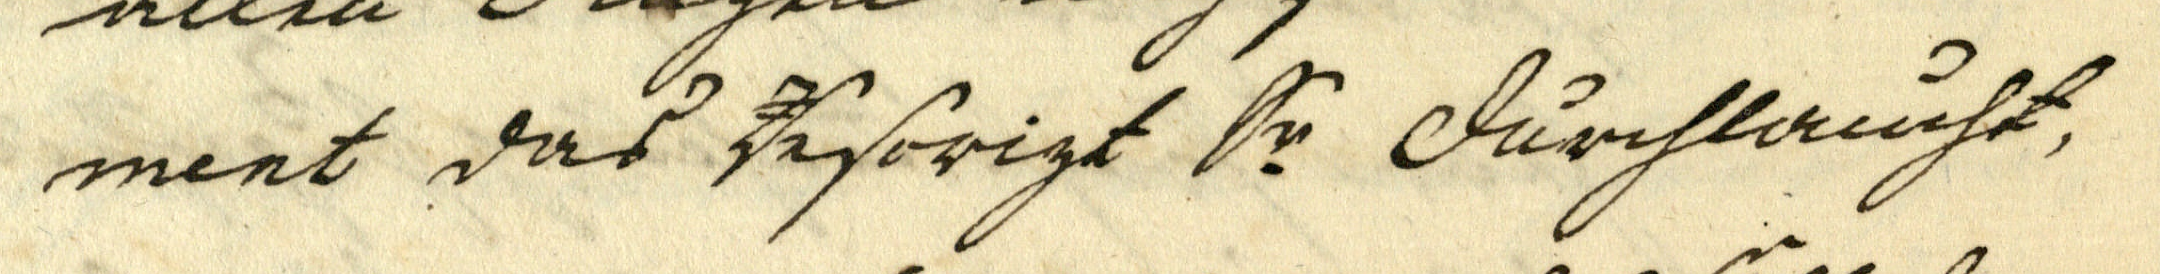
ment das Rescript Sr Durchlaucht,
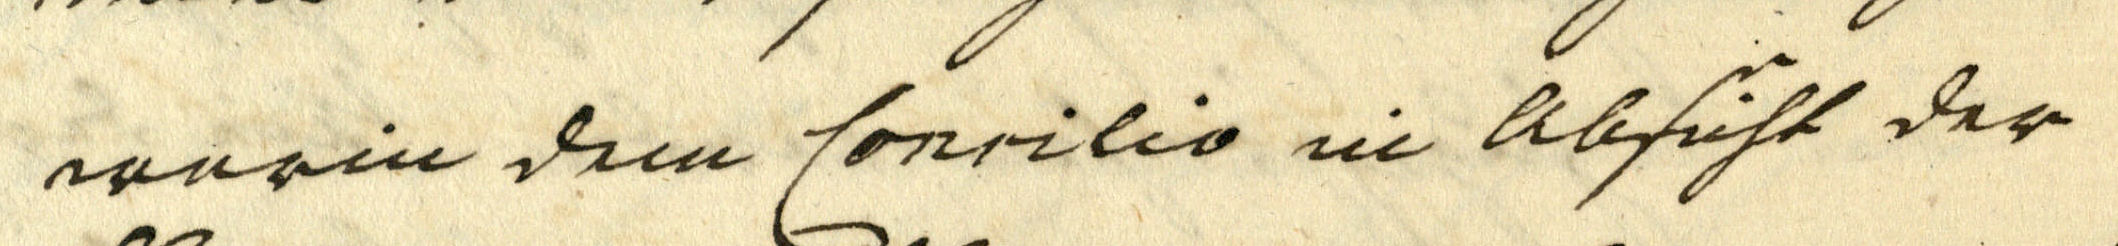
worin dem Concilio in Absicht der
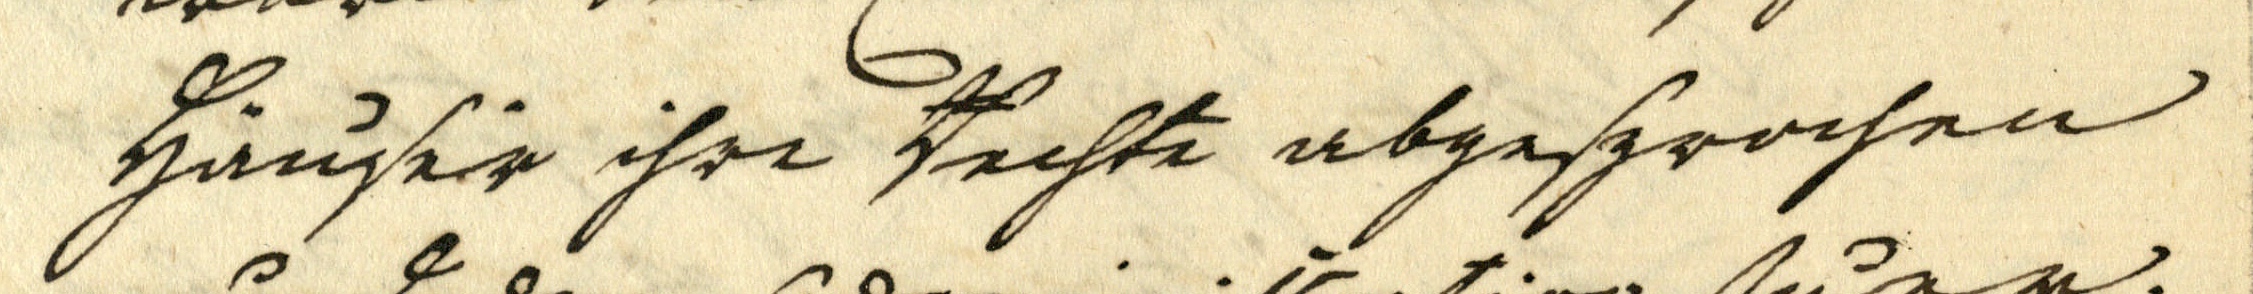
Häuser ihre Rechte abgesprochen
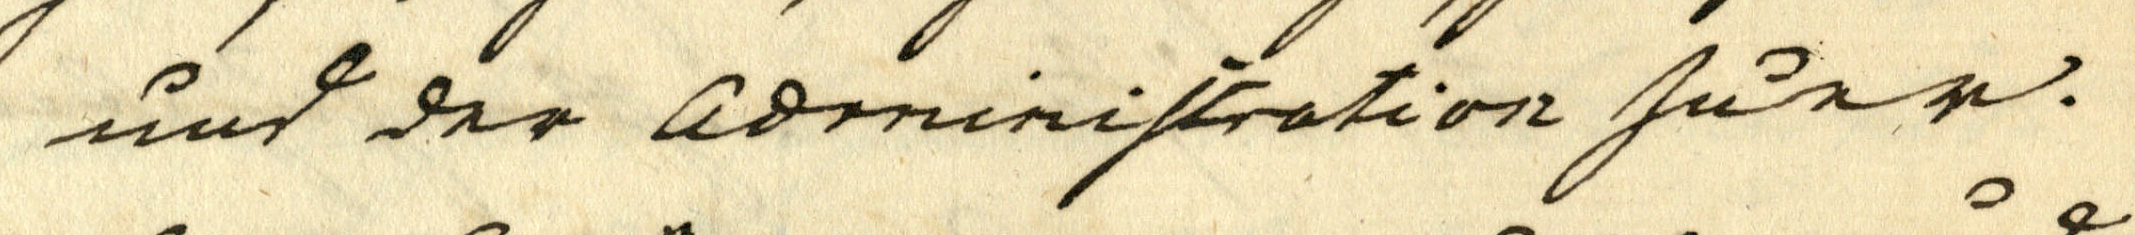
und der Administration zuer¬
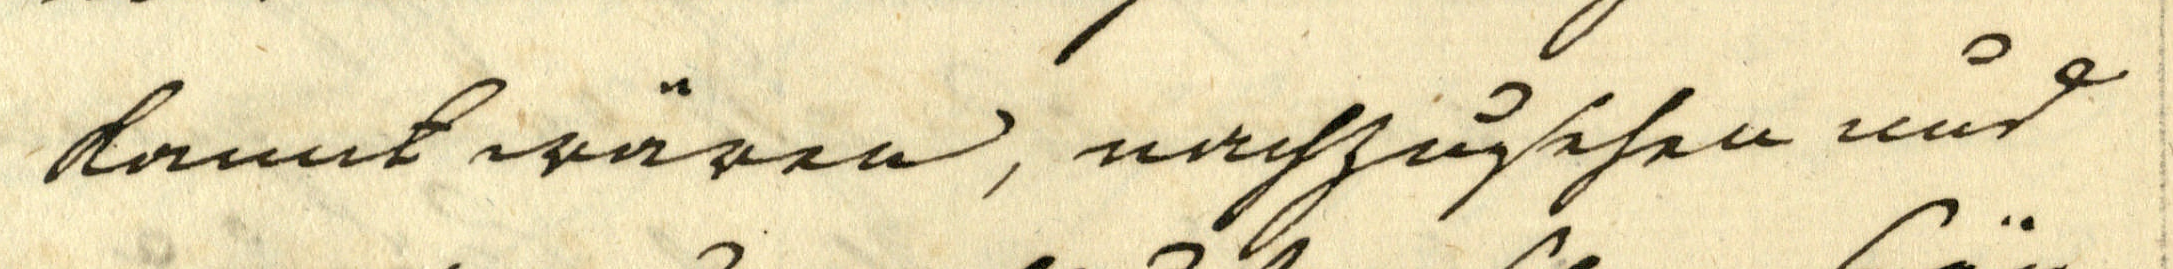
kanmnt wären, nachzusehen und
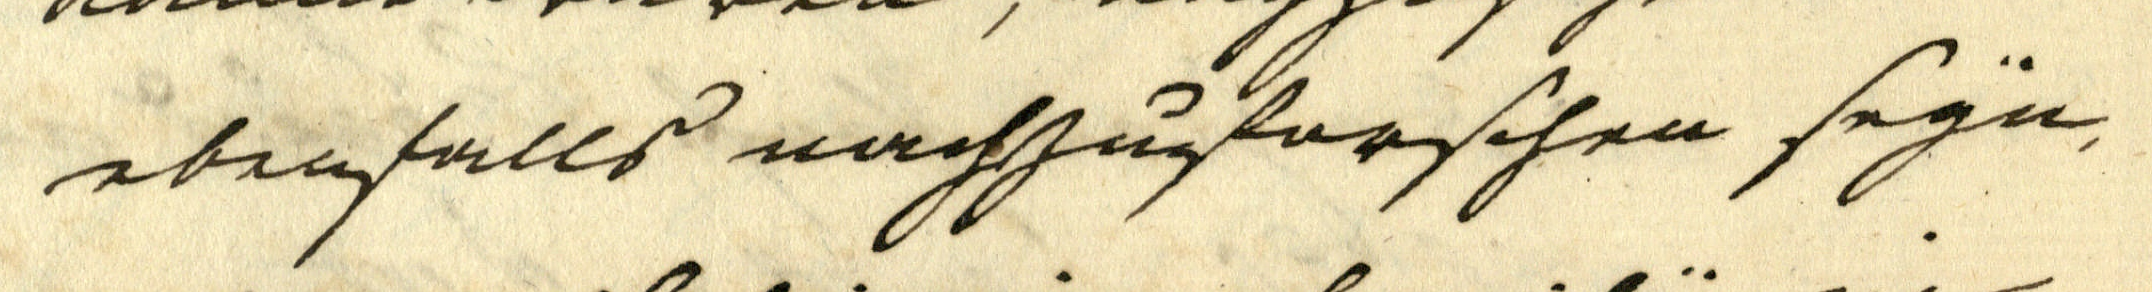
ebenfalls nachzuforschen seÿn,
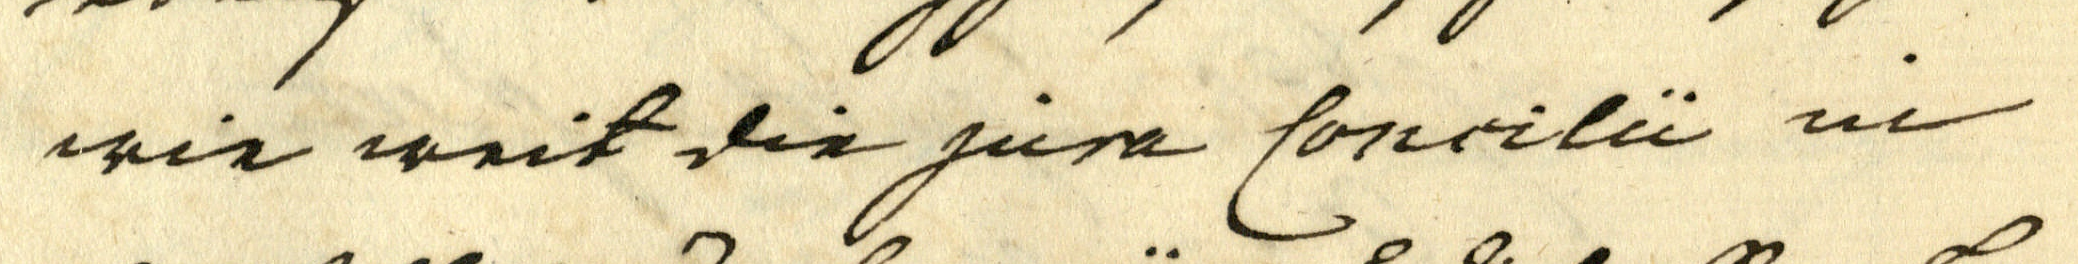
wie weit die jura Concilii in
